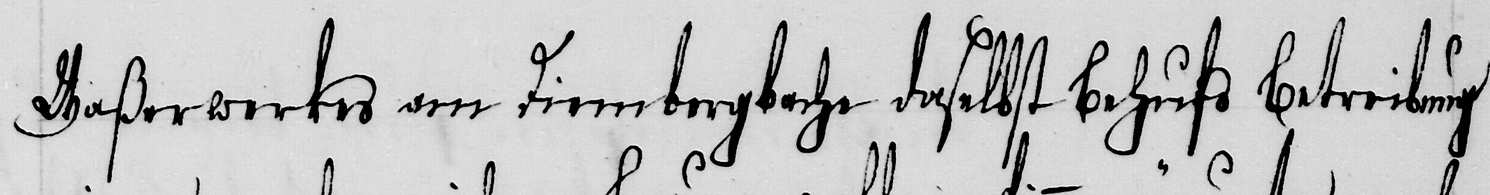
Waßerwerkes am Diembergbache daselbst Behufs Betreibung
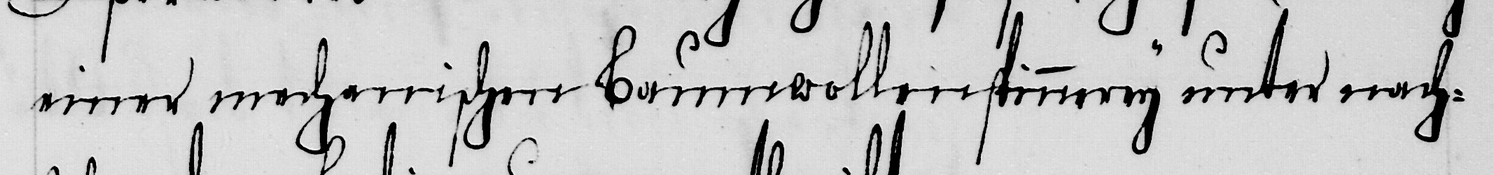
einer mechanischen Baumwollenspinnerey unter nach¬
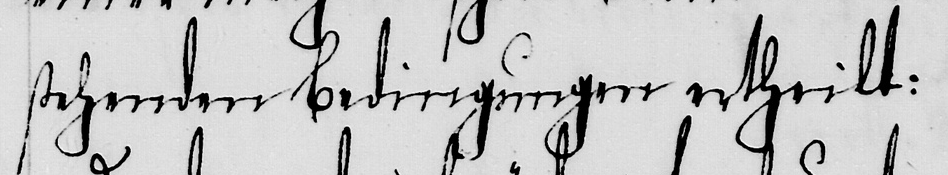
stehenden Bedingungen ertheilt:
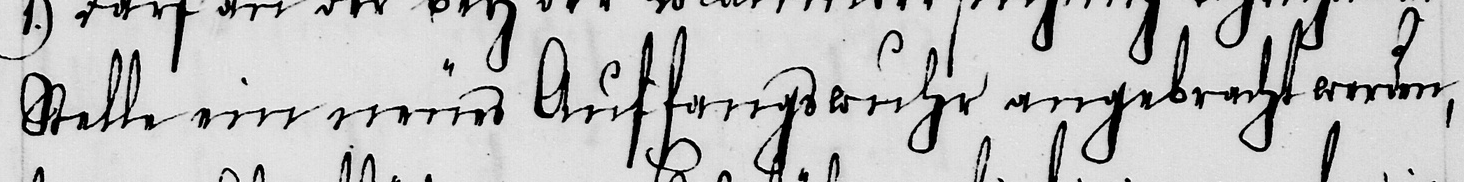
Stelle ein neues Auffangswuhr angebracht werden,
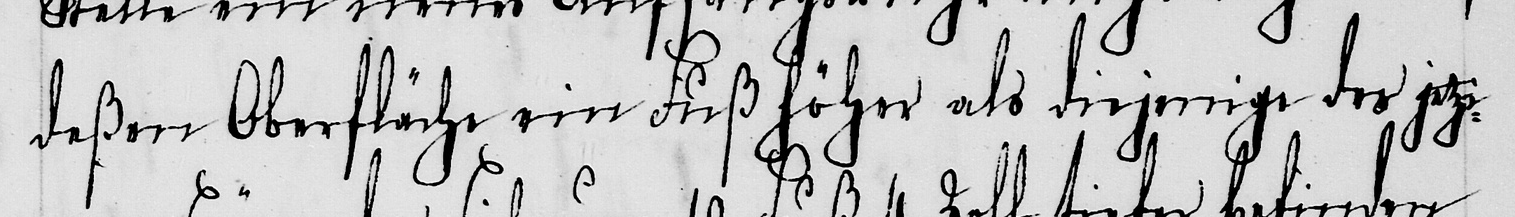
deßen Oberfläche ein Fuß höher als diejenige des j¬
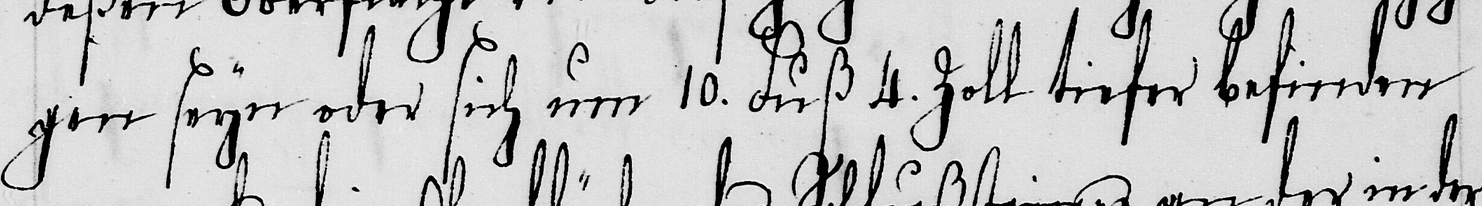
gen seyn oder sich um 10. Fuß 4. Zoll tiefer befinden
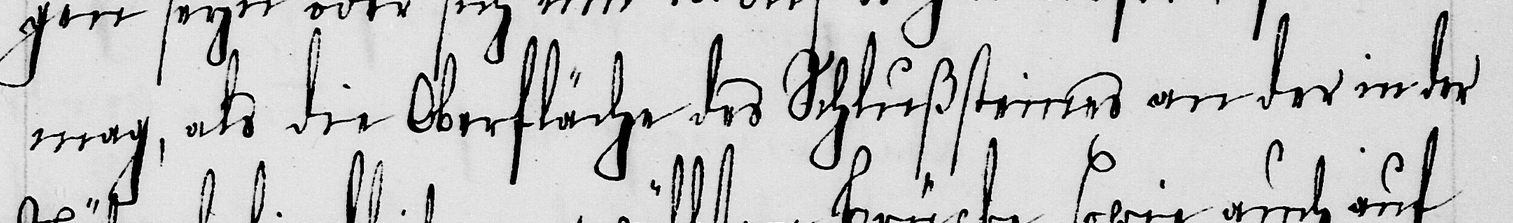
mag, als die Oberfläche des Schlußsteines an der in der
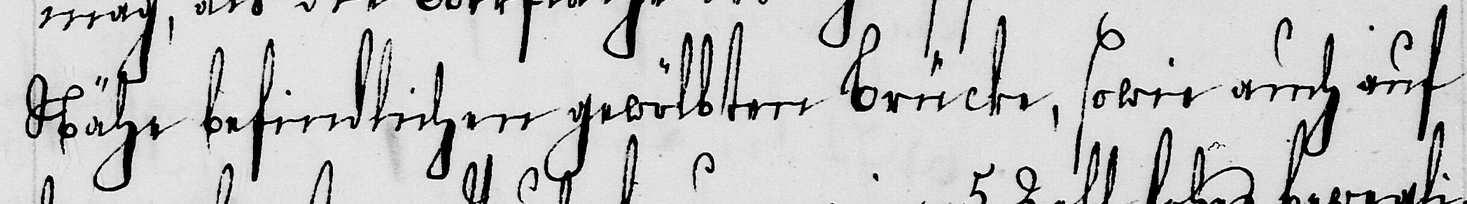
Nähe befindlichen gewölbten Brücke, sowie auch auf
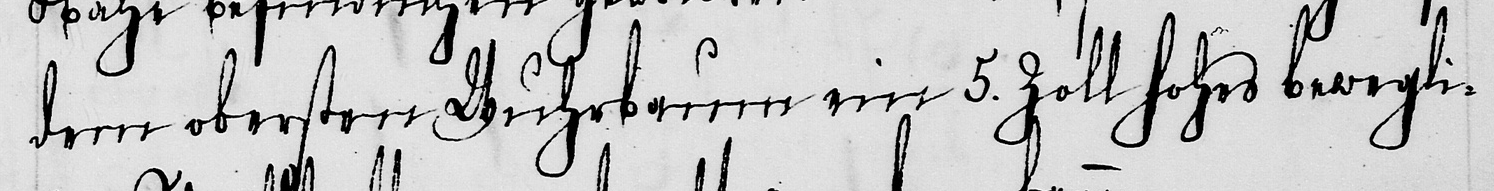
dem obersten Wuhrbaum ein 5. Zoll hohes bewegli¬
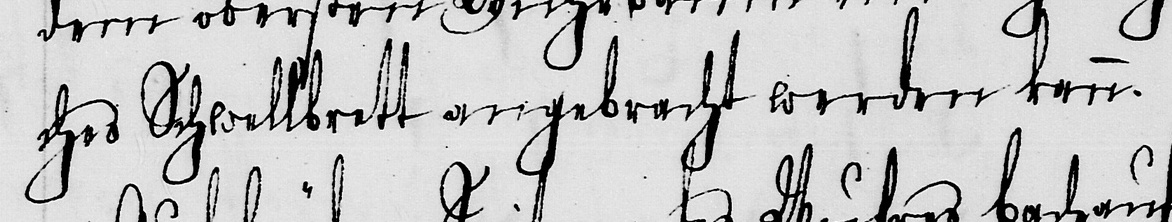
ches Schwellbrett angebracht werden kann.
